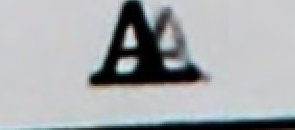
A
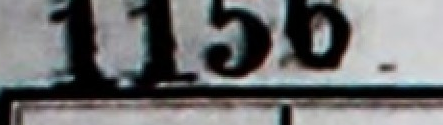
1156
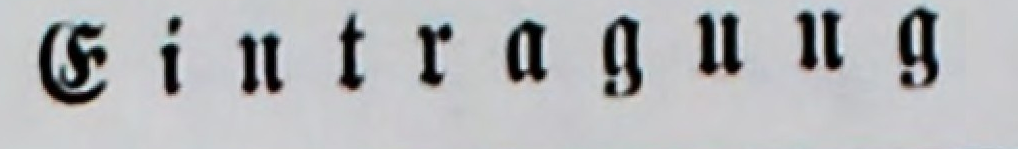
Eintragung
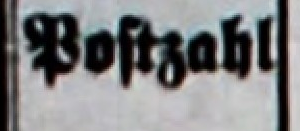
Postzahl
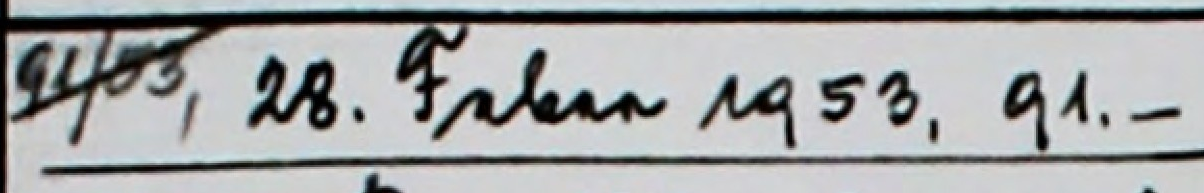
91/53, 28. Feber 1953, 91.-
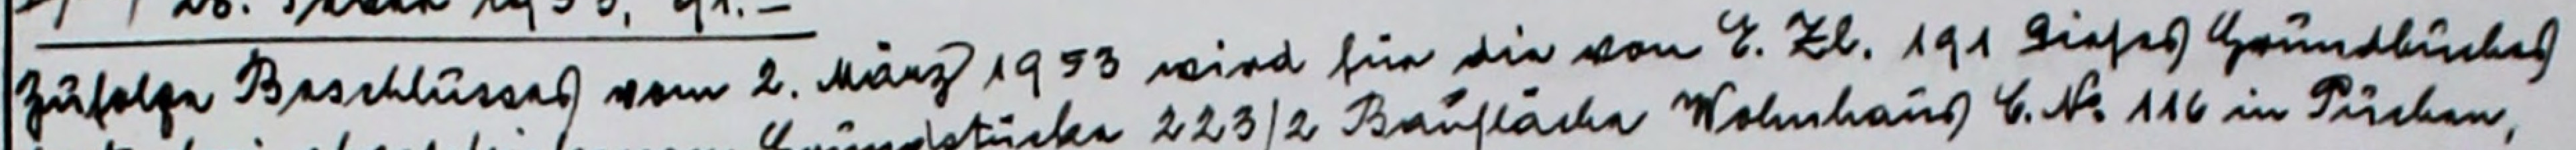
Zufolge Beschlusses vom 2. März 1953 wird für die von E. Zl. 191 Dieses Grundbuches
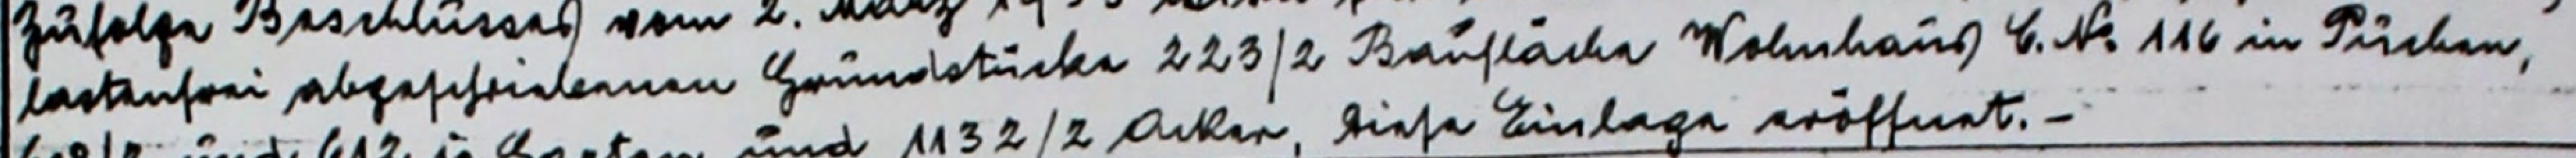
lastenfrei abgeschriebenen Grundstücker 223/2 Baufläche Wohnhaus C. No. 116 in Puchen,
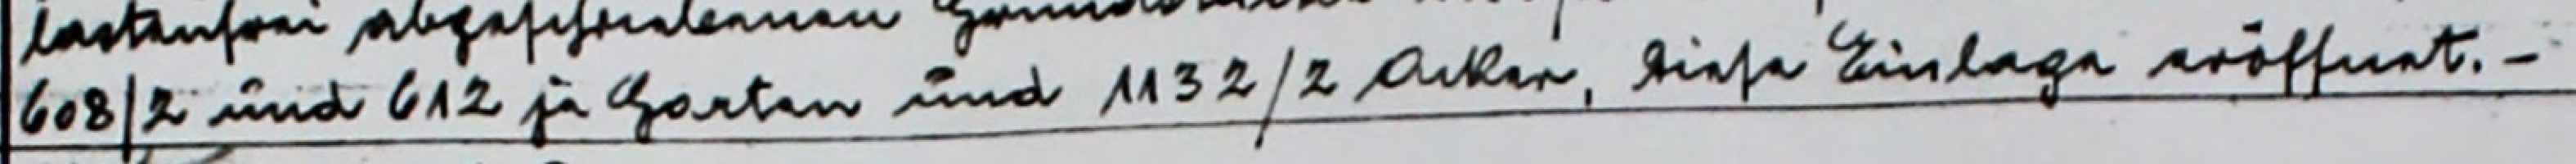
608/2 und 612 zu Garten und 1132/2 Acker, diese Einlage eröffnet.-
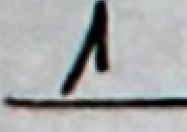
1
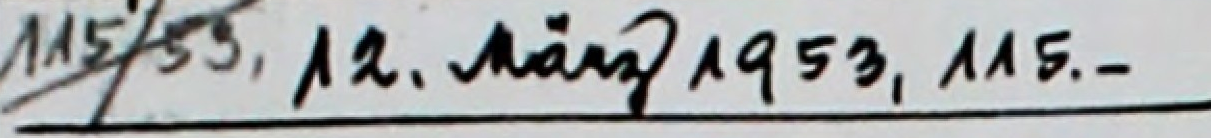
115/53, 12. März 1953, 115.-
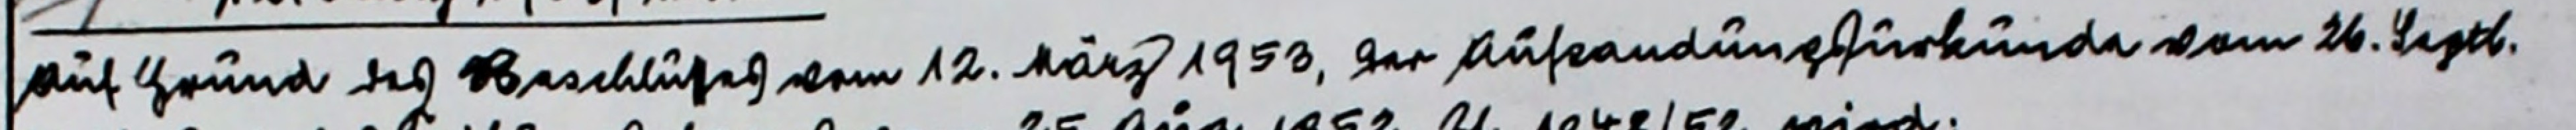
Auf Grund des Beschlusses vom 12. März 1953, der Aufsandungsurkunde vom 26. Septb.
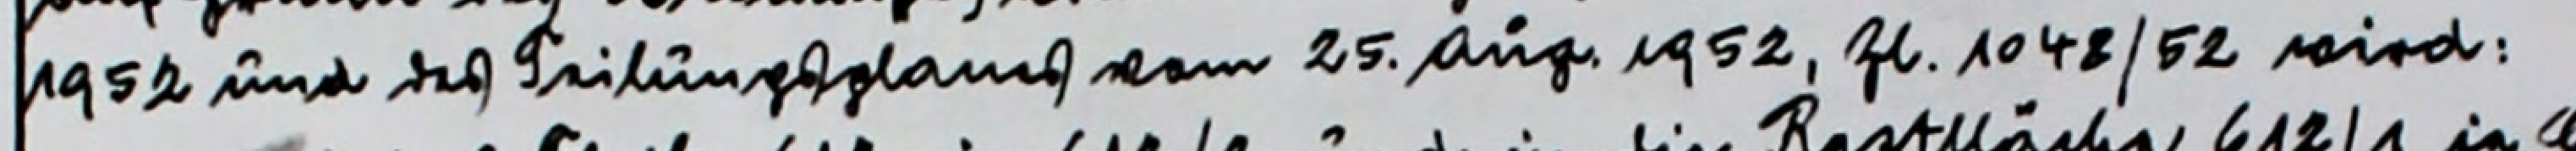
1952 und des Teilungsplanes vom 25. Aug. 1952, Zl. 1048/52 wird:
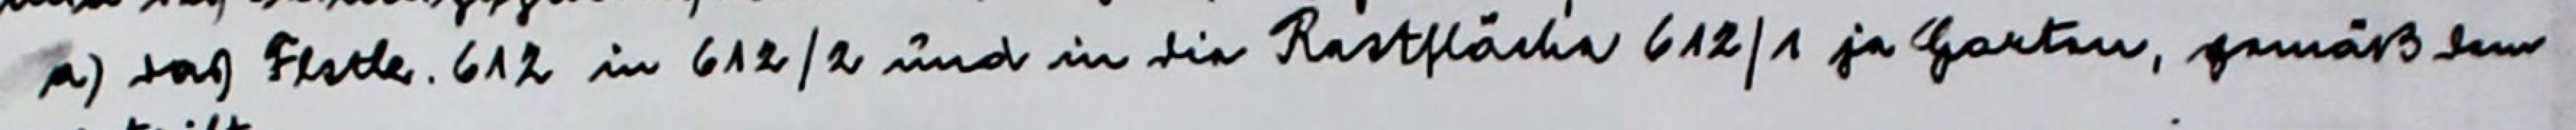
a) das Flstk. 612 in 612/2 und in die Rastfläche 612/1 je Garten, gemäß dem
